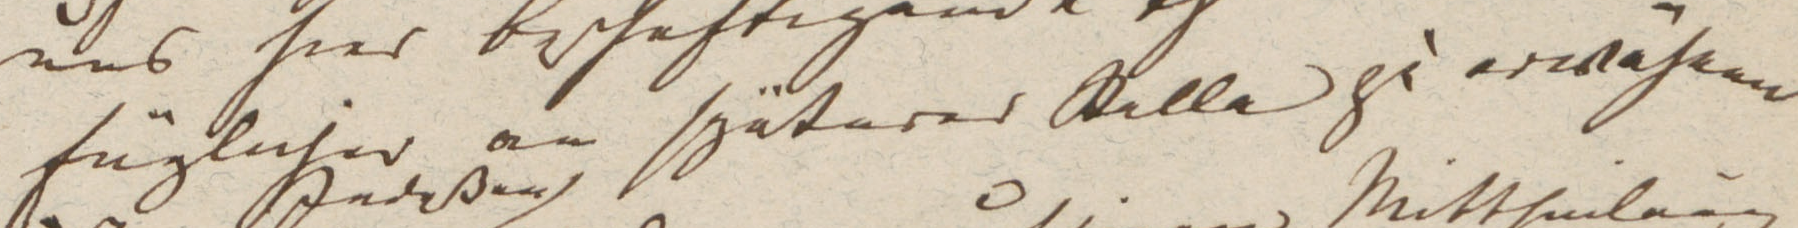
füglicher an späterer Stelle zu erwähnen
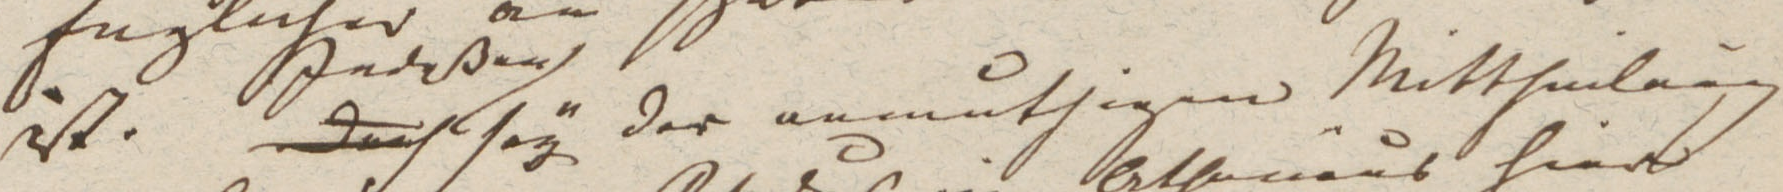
ist. Doch Indessen sey der anmuthigen Mittheilung
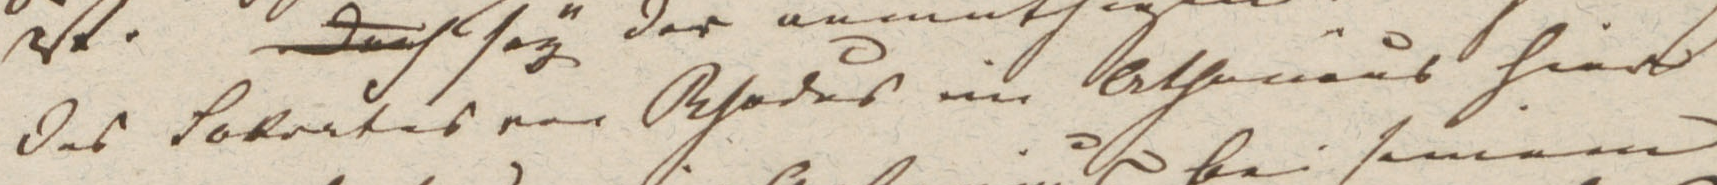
des Sokrates von Rhodus im Athenäus hier
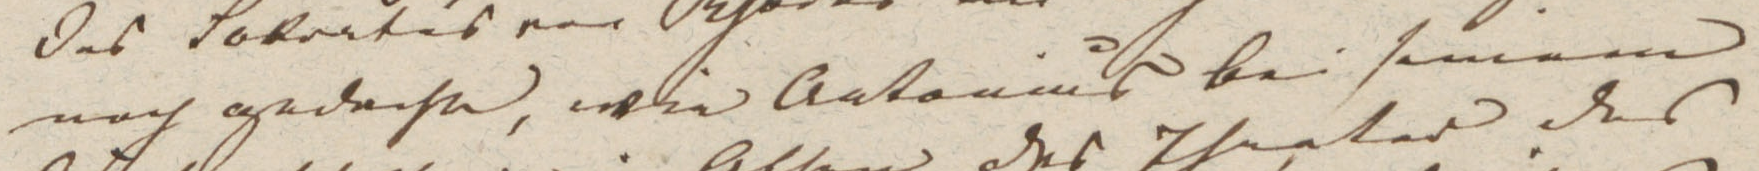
noch gedacht, wie Antonius bei seinem
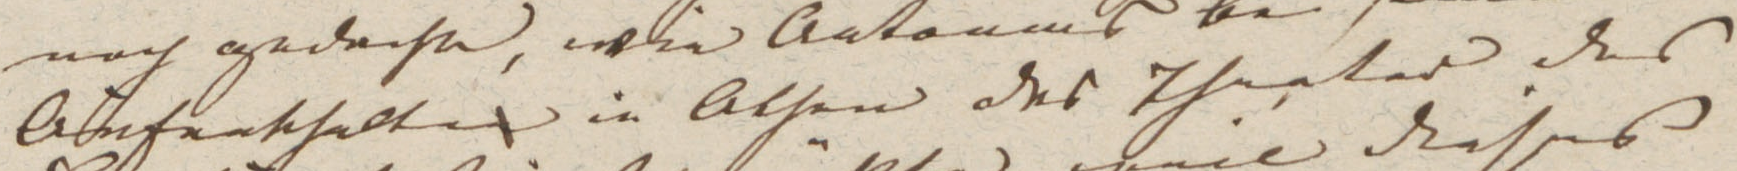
Aufenthalten in Athen das Theater des
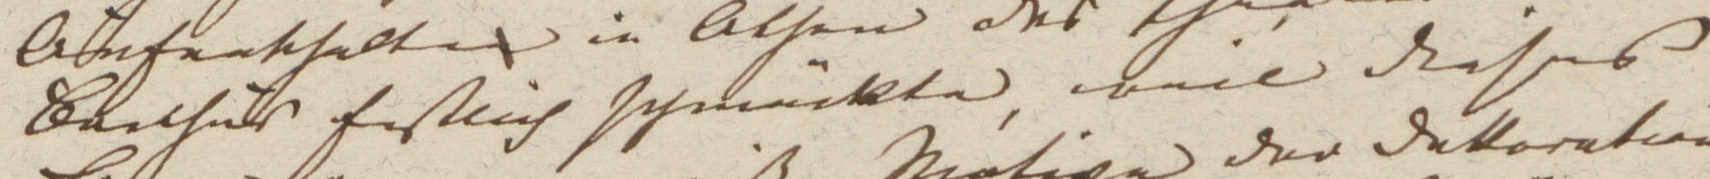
Bacchus festlich schmückte, weil dieses
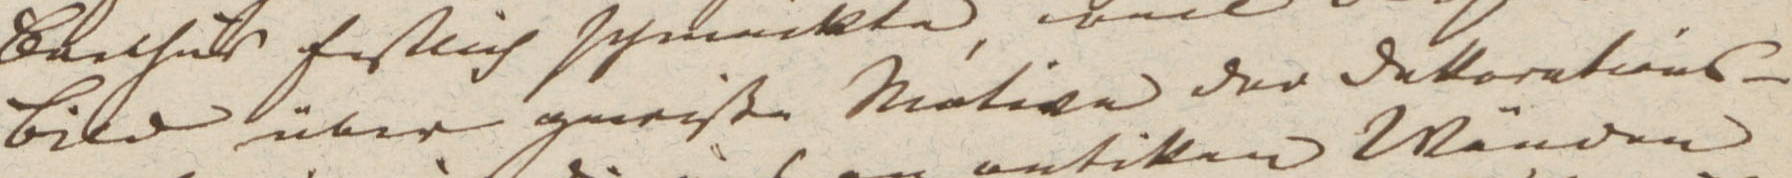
Bild über gewisse Motive der Dekorations-
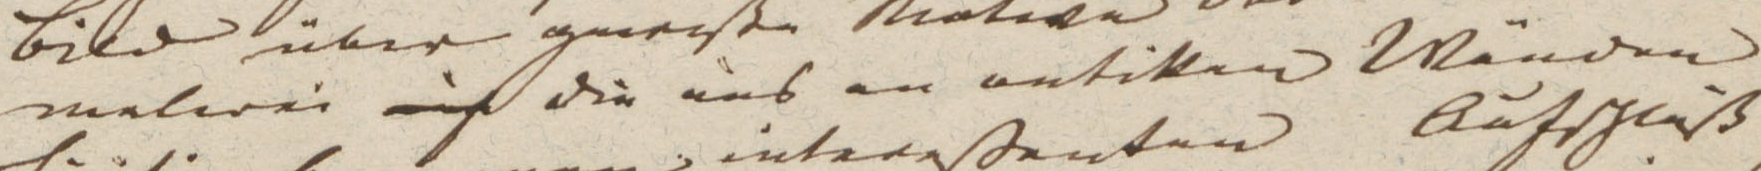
malerei auf die uns an antiken Wänden
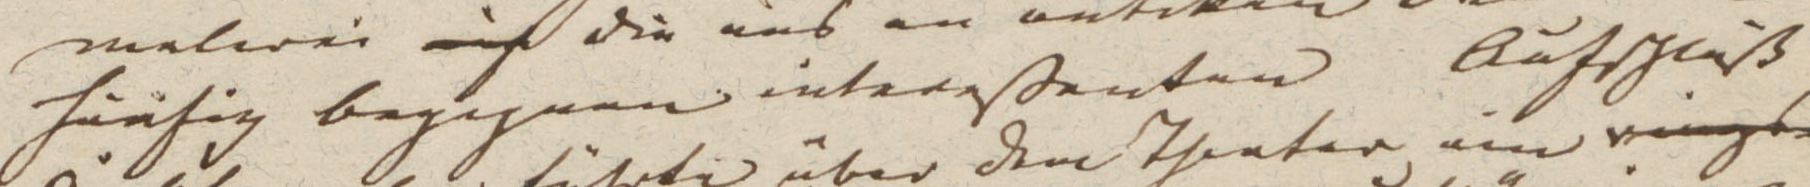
häufig begegnen interesanten Aufschluss
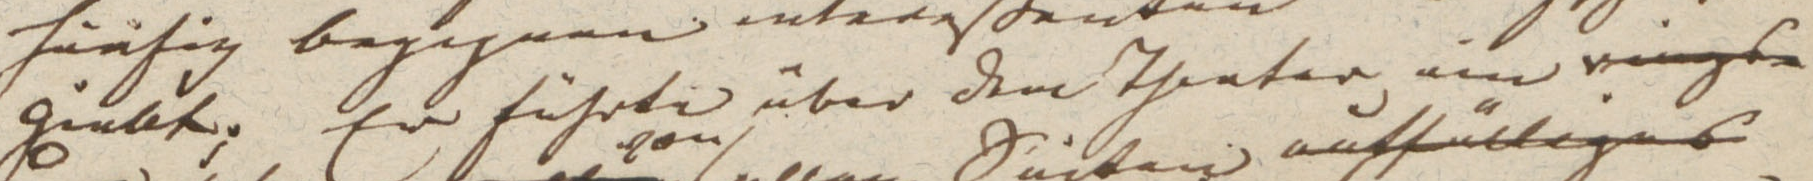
giebt; Er führte über dem Theater ein rings
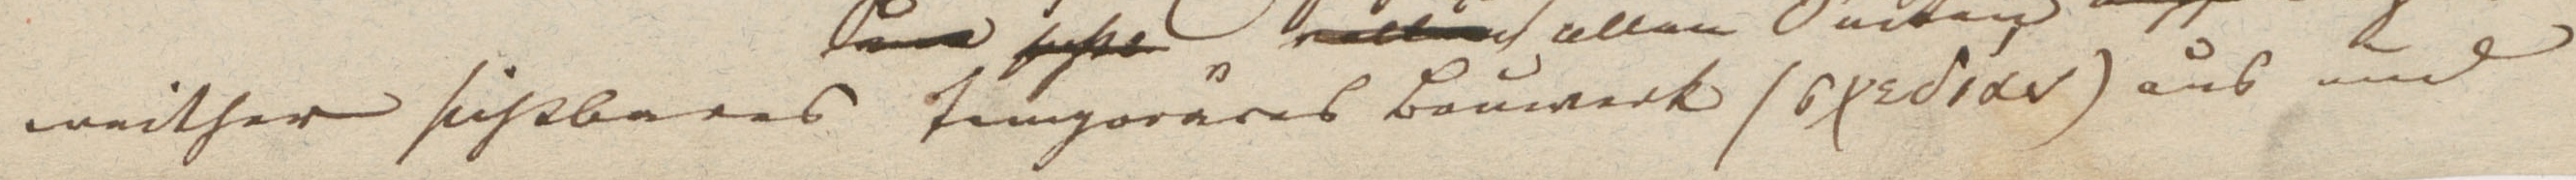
weither sichtbares temporäres Bauwerk (σχεδίαν) aus und
